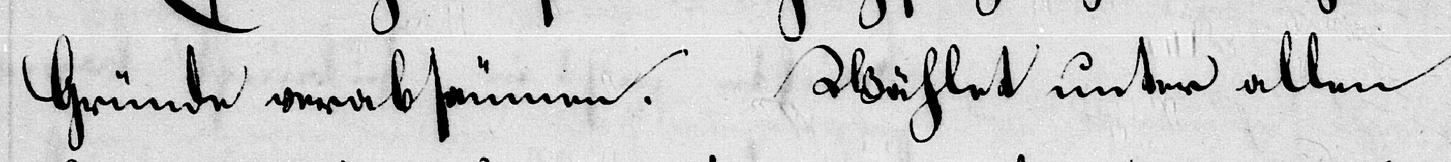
Gründe verabsäumen. Wählet unter allen
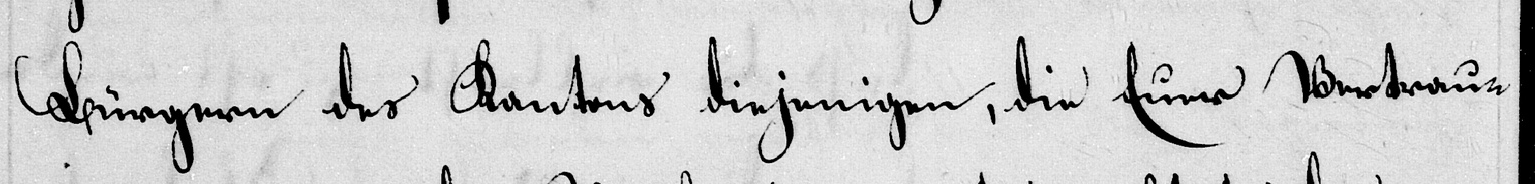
Bürgern des Kantons diejenigen, die Euer Vertrau¬
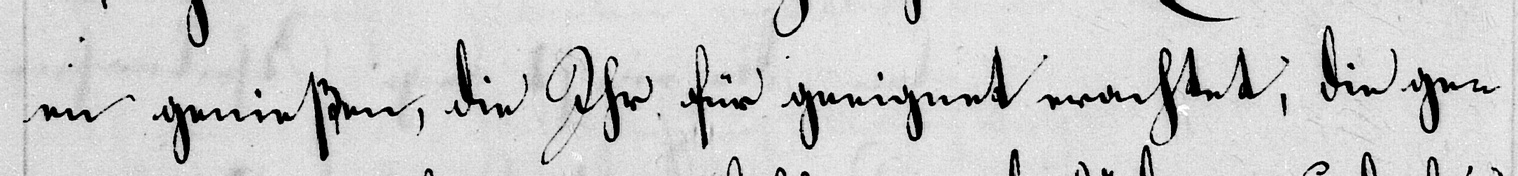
en genießen, die Ihr für geeignet erachtet, die ge¬
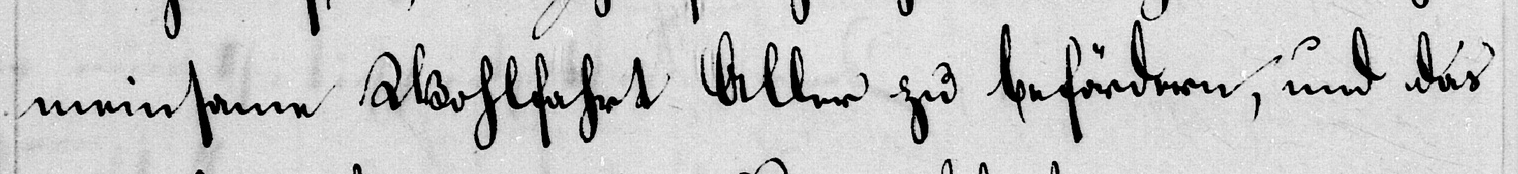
meinsame Wohlfahrt Aller zu befördern, und das
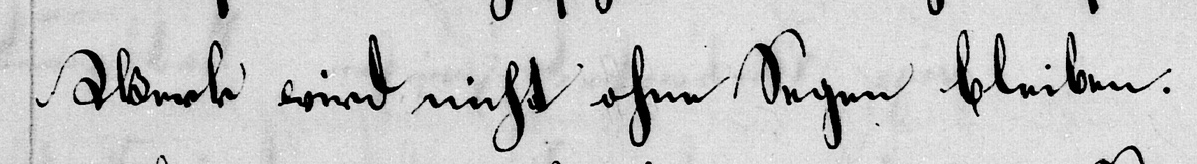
Werk wird nicht ohne Segen bleiben.
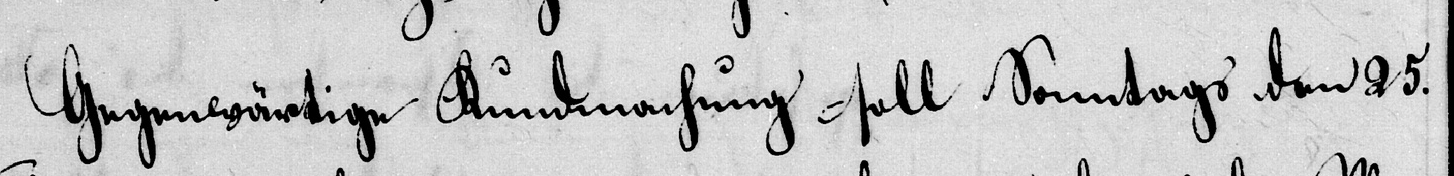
Gegenwärtige Kundmachung soll Sonntags den 25.
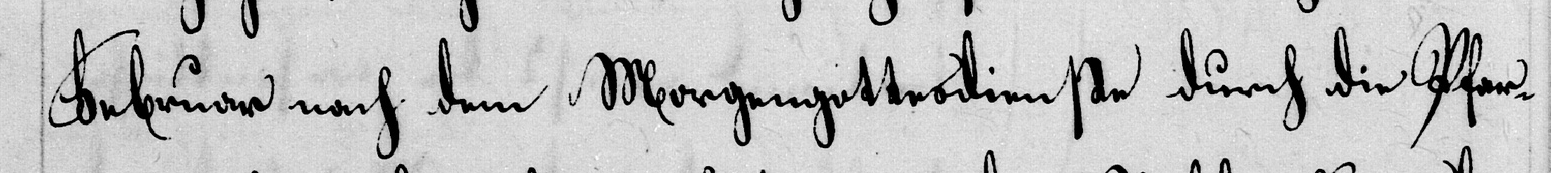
Februar nach dem Morgengottesdienste durch die Pfar¬
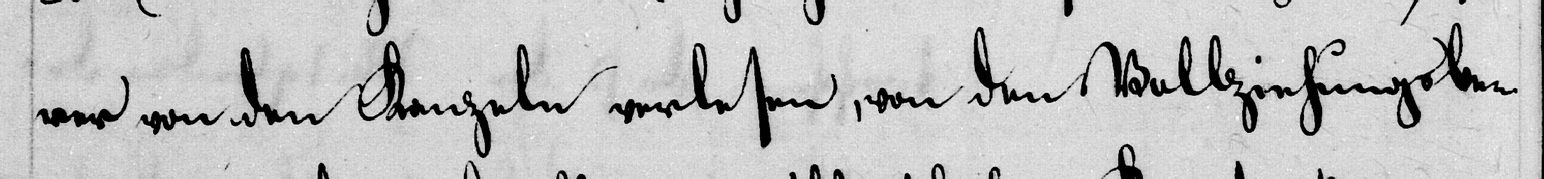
rer von den Kanzeln verlesen, von dem Vollziehungsbe¬
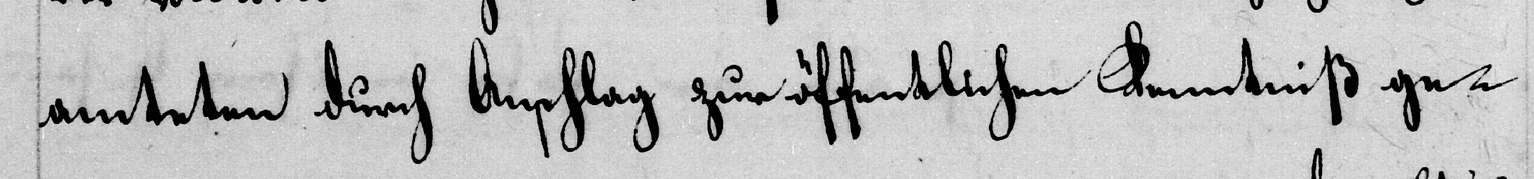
amteten durch Anschlag zur öffentlichen Kenntniß ge-
